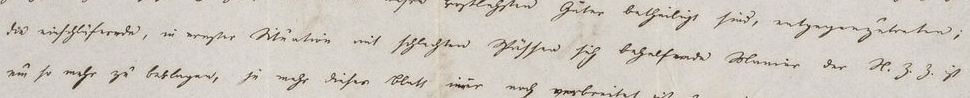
die einschläfernde, in ernster Situation mit schlechten Spässen sich behelfende Manier der N.Z.Z. ist
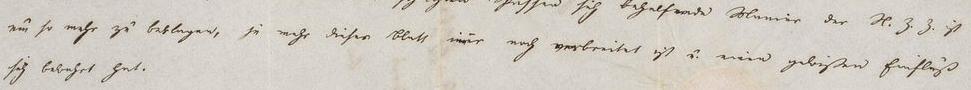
um so mehr zu beklagen, je mehr dieses Blatt immer noch verbreitet ist u. einen gewißen Einfluß
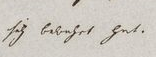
sich bewahrt hat.
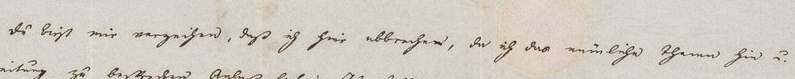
Du wirst mir verzeihen, daß ich hier abbreche, da ich das nämliche Thema hin u.
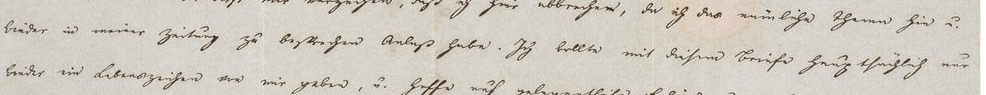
wieder in meiner Zeitung zu besprechen Anlaß habe. Ich wollte mit diesem Briefe hauptsächlich nur
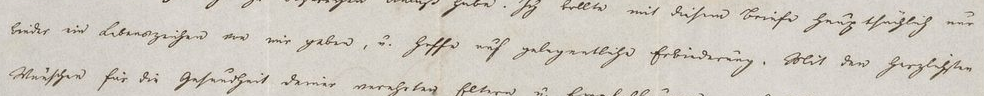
wieder ein Lebenszeichen von mir geben, u. hoffe auf gelegentliche Erwiederung. Mit den herzlichsten
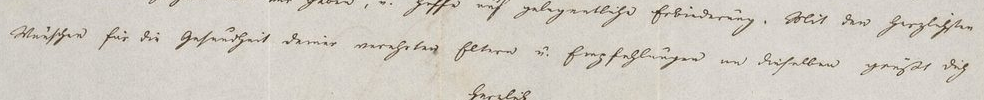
Wünschen für die Gesundheit Deiner verehrten Eltern u. Empfehlungen an dieselben grüßt Dich
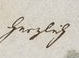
herzlich
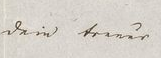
Dein treuer
